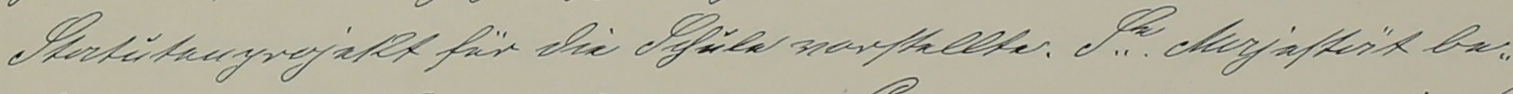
Statutenprojekt für die Schule vorstellte. Se. Majestät be-
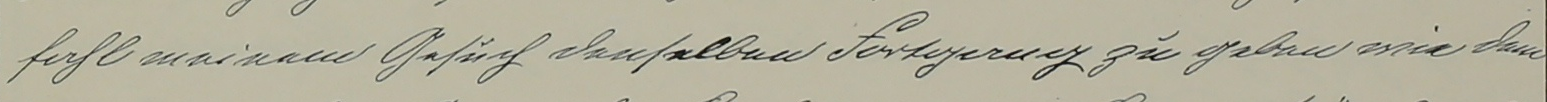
fahl, meinem Gesuch denselben Fortgang zu geben wie dem
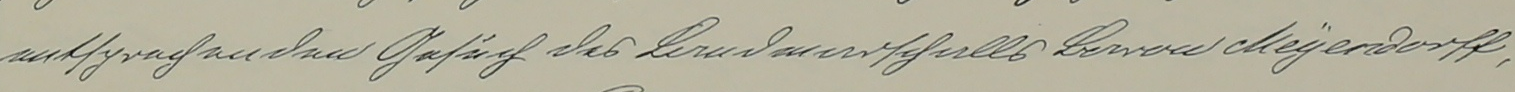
entsprechenden Gesuch des Landmarschalls Baron Meyendorff,
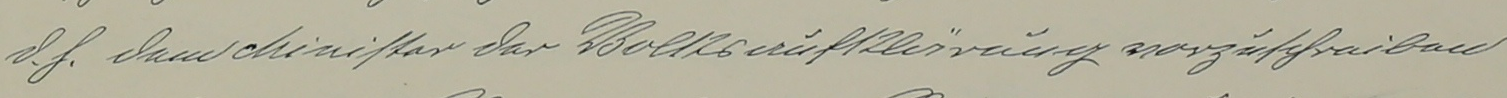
d.h. dem Minister der Volksaufklärung vorzuschreiben
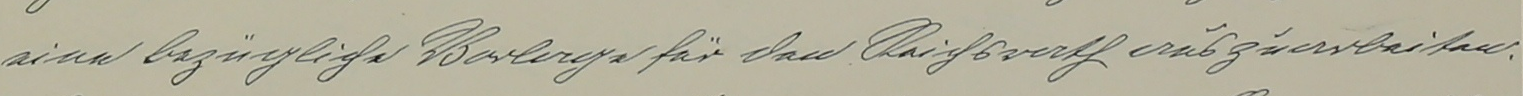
eine bezügliche Vorlage für den Reichsrath auszuarbeiten.
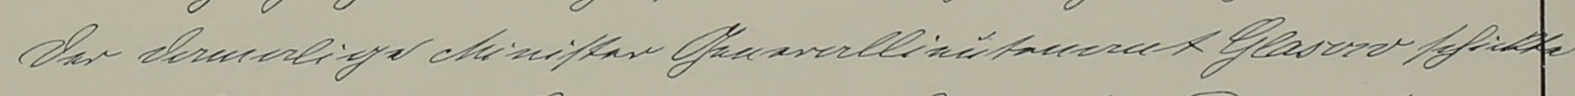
Der damalige Minister Generallieutenant Glasow schickte
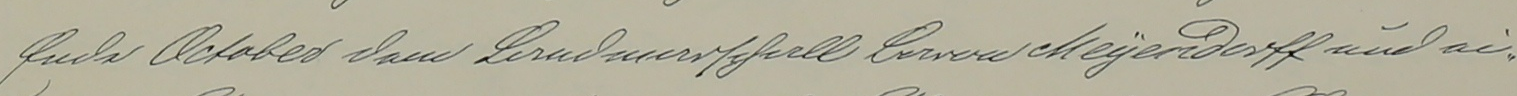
Ende October dem Landmarschall Baron Meyendorff und ei-
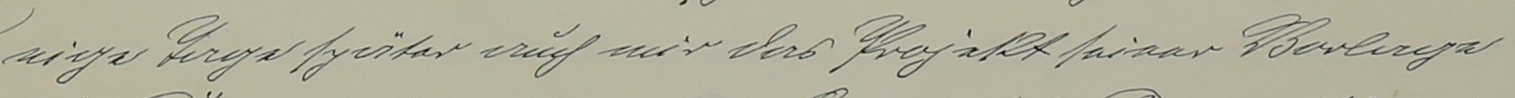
nige Tage später auch mir das Projekt seiner Vorlage
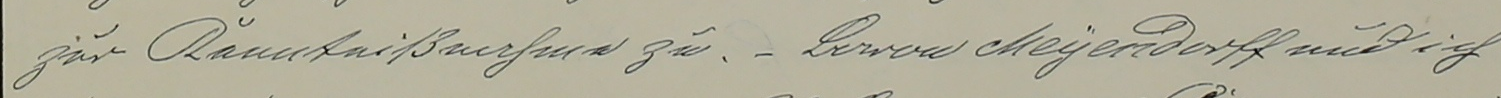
zur Kenntnißnahme zu. – Baron Meyendorff und ich
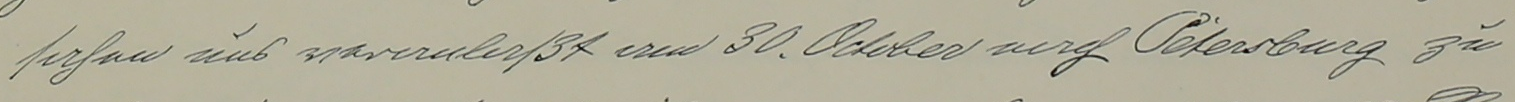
sahen uns veranlaßt am 30. October nach Petersburg zu
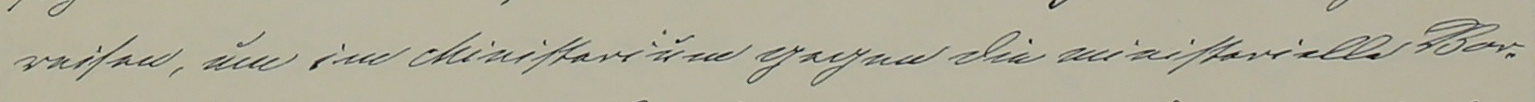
reisen, um im Ministerium gegen die ministerielle Vor-
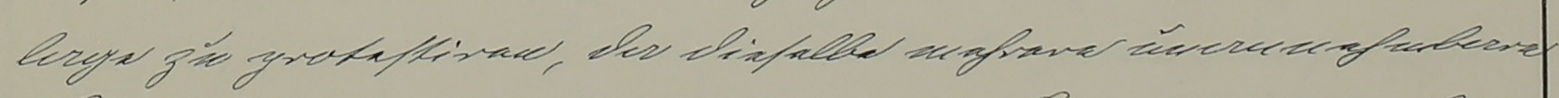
lage zu protestiren, da dieselbe mehrere unannehmbare
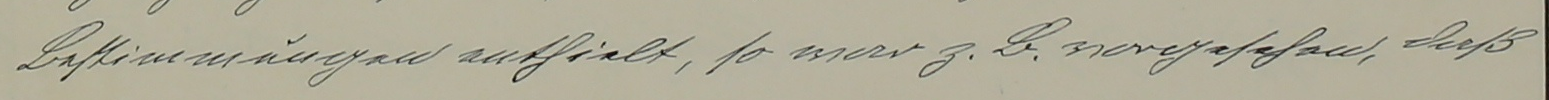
Bestimmungen enthielt, so war z.B. vorgesehen, daß
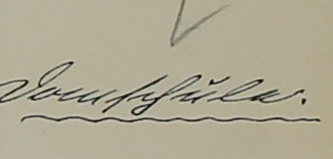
Domschule.
